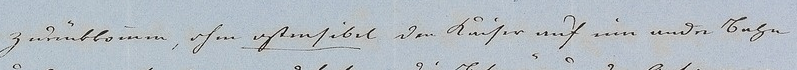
zurückkommen, ohne ostensibel den Kaiser auf eine andre Bahn
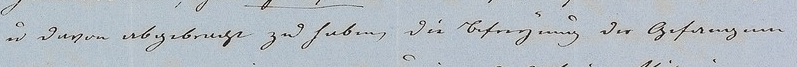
u davon abgebracht zu haben, die Befreyung der Gefangnen
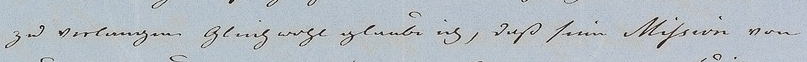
zu verlangen. Gleichwohl glaube ich, daß seine Mission von
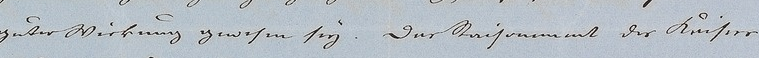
guter Wirkung gewesen sey. Das Raisonement des Kaisers
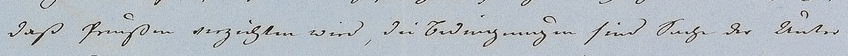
daß Preußen verzichten wird, die Bedingungen sind Sache der Unter-
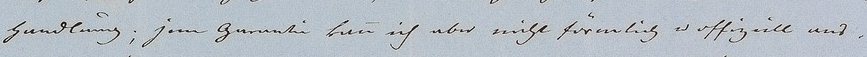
handlung; jene Garantie kann ich aber nicht förmlich u offiziell aus-
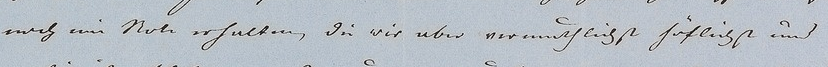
noch eine Note erhalten, die wir aber vermuthlichst höflichst und
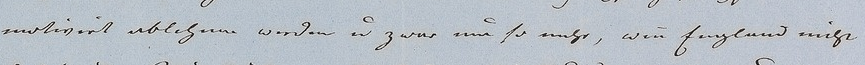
motivirt ablehnen werden u zwar um so mehr, wenn England nicht
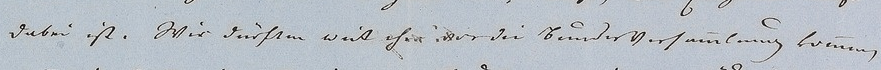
dabei ist. Wir dürften weit eher vor die Bundesversammlung kommen,
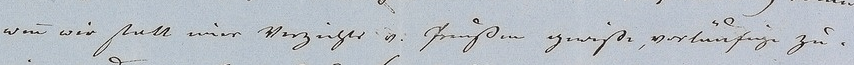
wenn wir statt eines Verzichts v. Preußen gewisse, vorläufige Zu-
